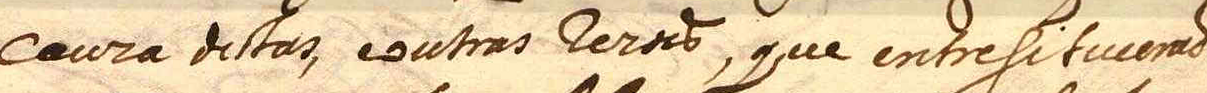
cauza destas, e outras Rezões, que entre si tiueraõ
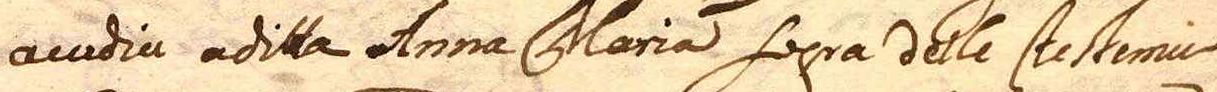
accodiu a ditta Anna Maria sogra delle testemu
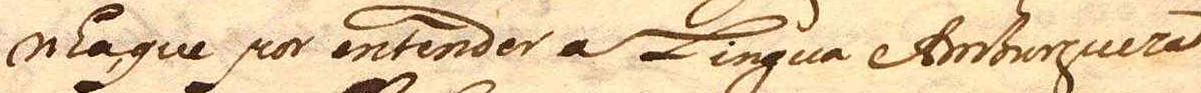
nha, que por entender a Lingua Amburgueza
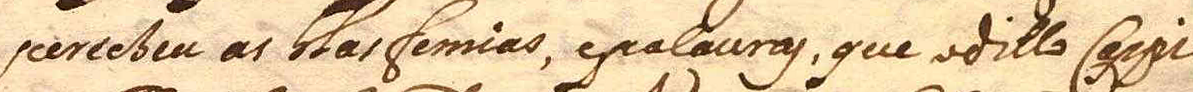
percebeu as blasfemias, e palauras, que o ditto Cappi
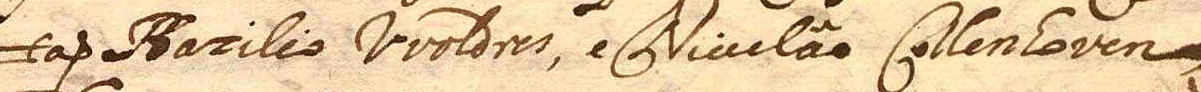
taõ Bazilio Vvoldres, e Niculâo Collenhoven
